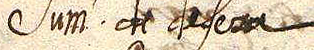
Sumo. de defeza
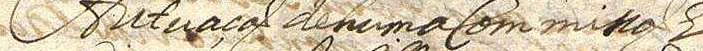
Autuaçaõ de huma Commissaõ E
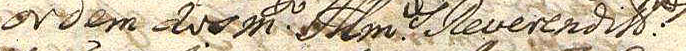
ordem dos mto. Illm.os Reuerendiss:mos
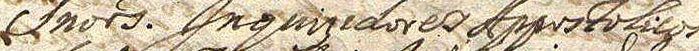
Snor̄s. Jnquizidores Appostolicos
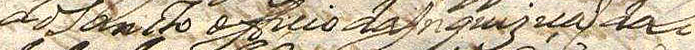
do Sancto offiçio da Jnquiziçaõ da Ci
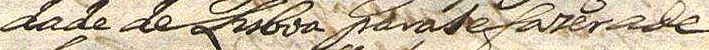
dade de Lisboa para se fazer a de
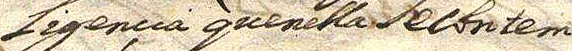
Ligençia que nella se contem
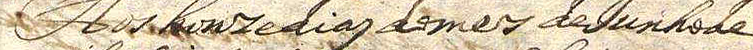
Aos honze dias do mez de Iunho de
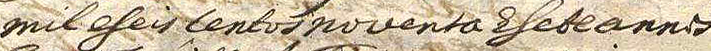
mil e seisçentos noventa E sete annos
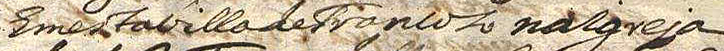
Em esta villa de Trancoso na igreja
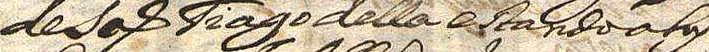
de Saõ Tiago della estando ahy
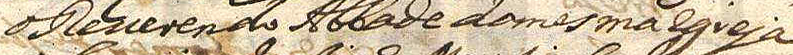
o Reuerendo Abbade da mesma egreja
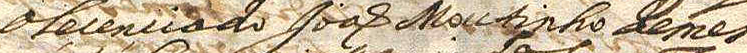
o leçençiado Joaõ Moutinho de mes
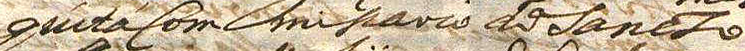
quita Commissario do Sancto
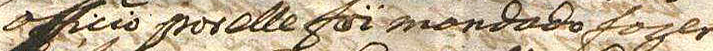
offiçio por elle foi mandado fazer
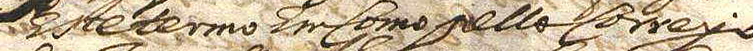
Este termo Em Como pello Correyo
